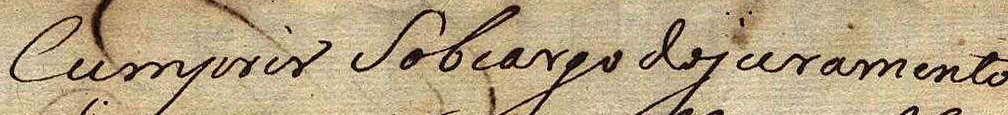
Cumprir Sob cargo do juramento
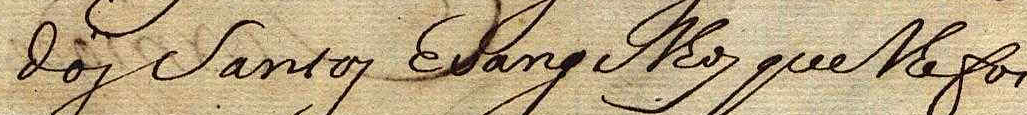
dos Santos Evangelhos que lhe foi
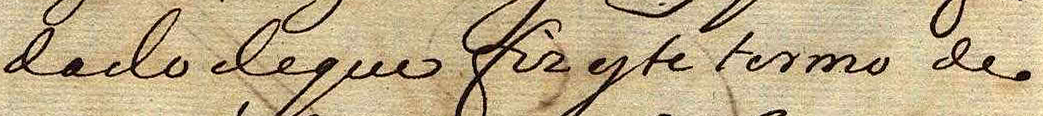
dado, de que fiz este termo de
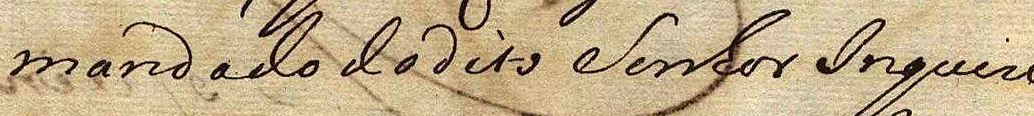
mandado do dito Senhor Inquizi
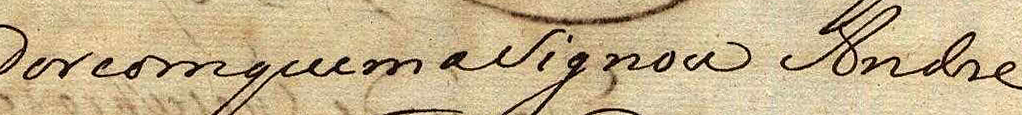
dor com quem aSignou Andre
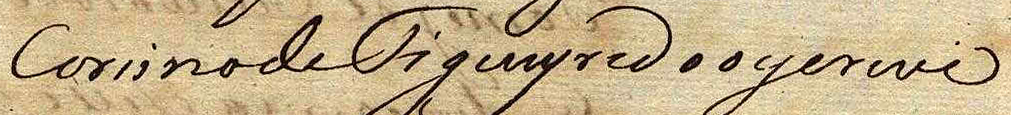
Corsino de Figueyredo o escrevi
